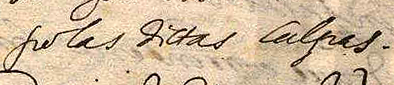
polas dittas culpas.
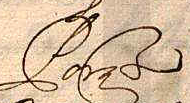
Porq̄
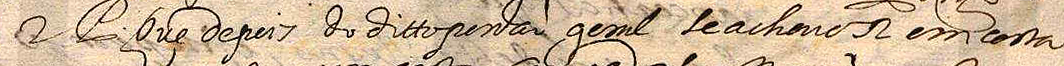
2 P. Que depois do ditto perdaõ geral se achou o R em certa
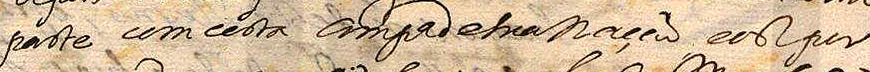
parte com certa compa de sua naçaõ e o R per
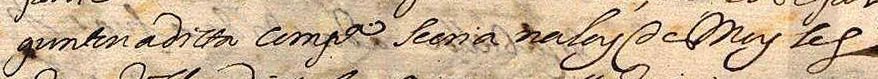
guntou a ditta compa se cria na ley de Moyses
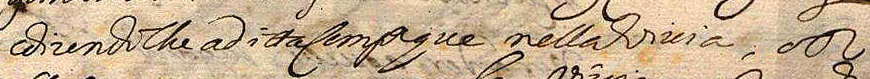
e dizendolhe a ditta Compa que nella Viuia, o R
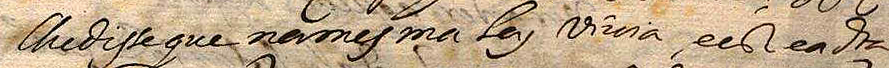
lhe disse que na mesma Ley viuia, e o R e a dta
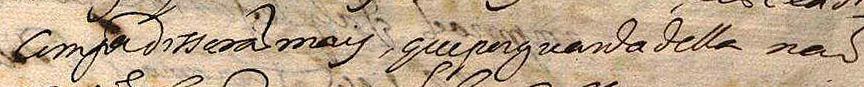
compa disseraõ mais, que por guarda della naõ
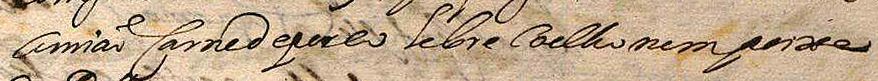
comiaõ Carne de porco lebre Coelho nem peixe
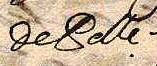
de Pelle.
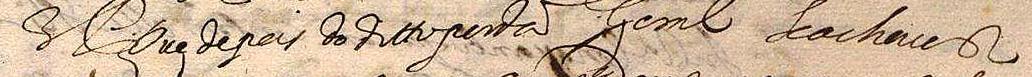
3 P. Que depois do ditto perdaõ Geral se achaua R
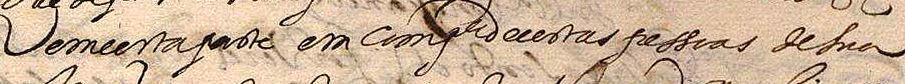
em certa parte em compa de certas pessoas de sua
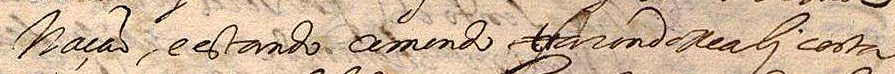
Naçaõ, e estando comendo fazendosse alj certa
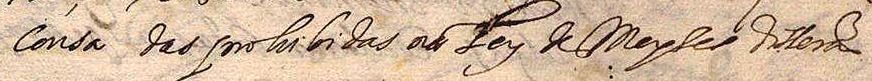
cousa das prohibidas na Ley de Moyses disseraõ
